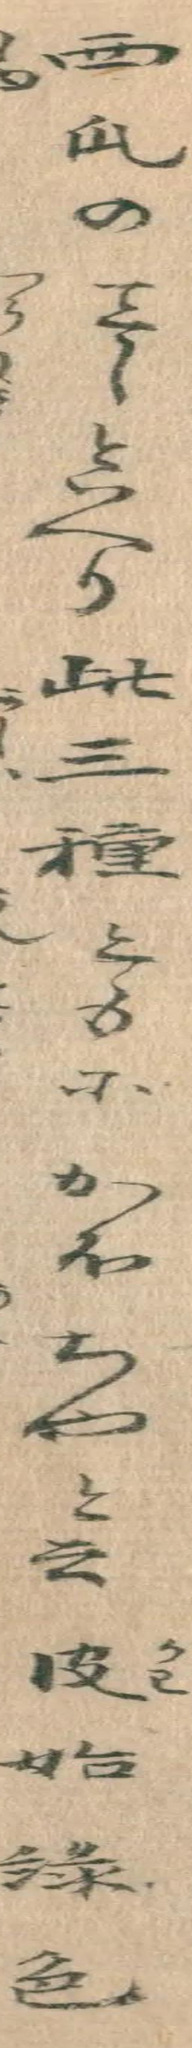西瓜のことしといへり此三種ともにかほちやと云皮始緑色
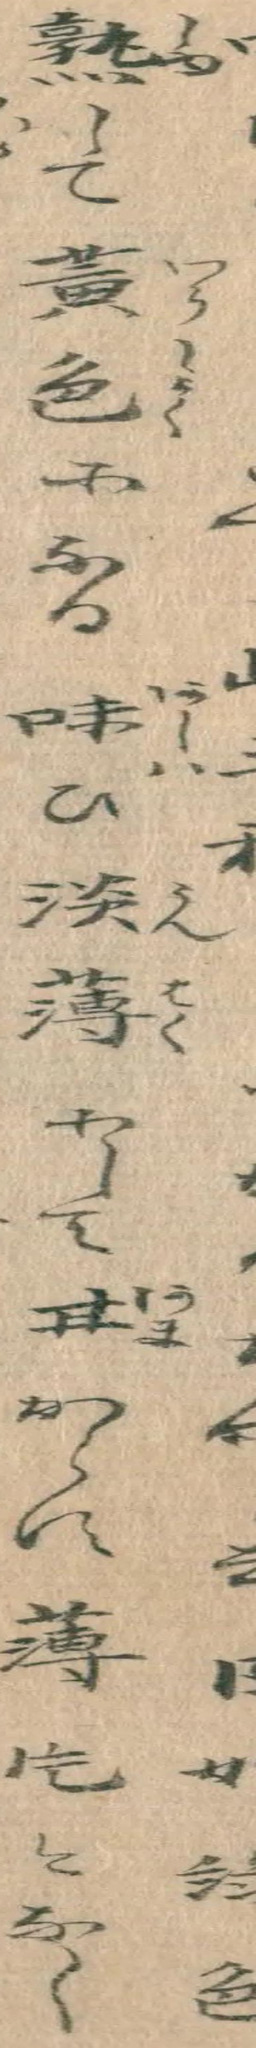熟して黄色になる味ひ淡薄にして甘からす薄片となし
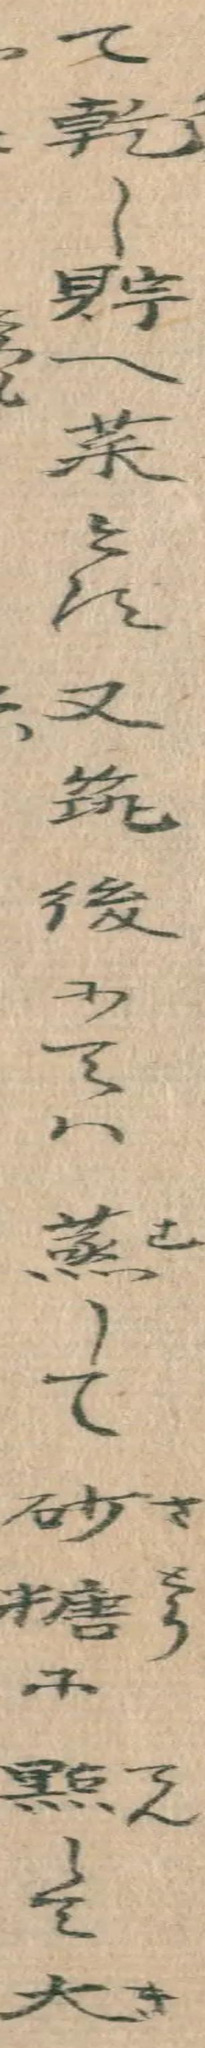て乾し貯へ菜とす又筑後にては蒸して砂糖に点して大
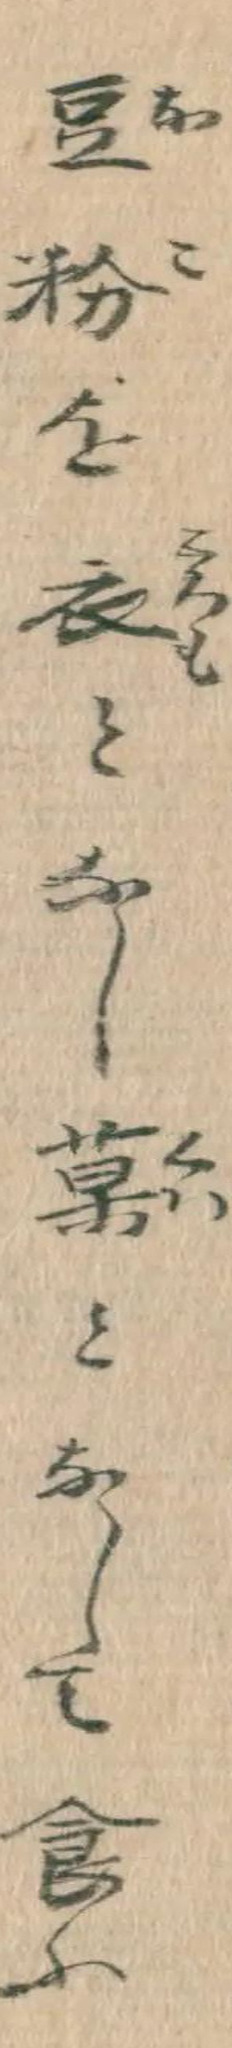豆粉を衣となし菓となして食ふ

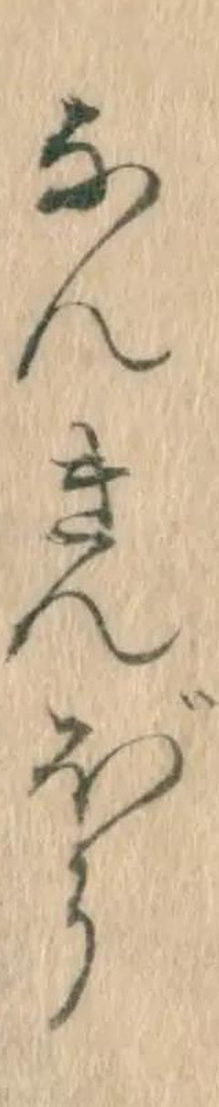なんきんぼう
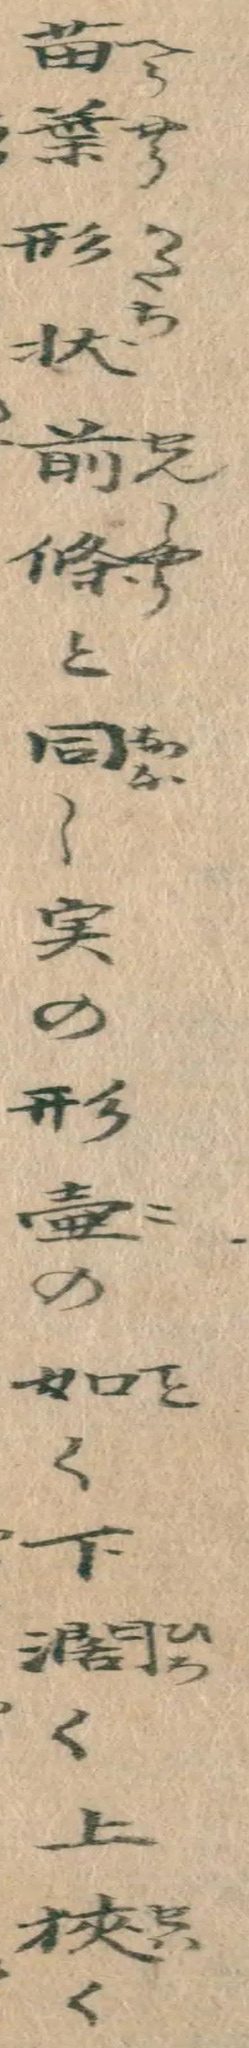苗葉形状前條と同し実の形壺の如く下濶く上狭く
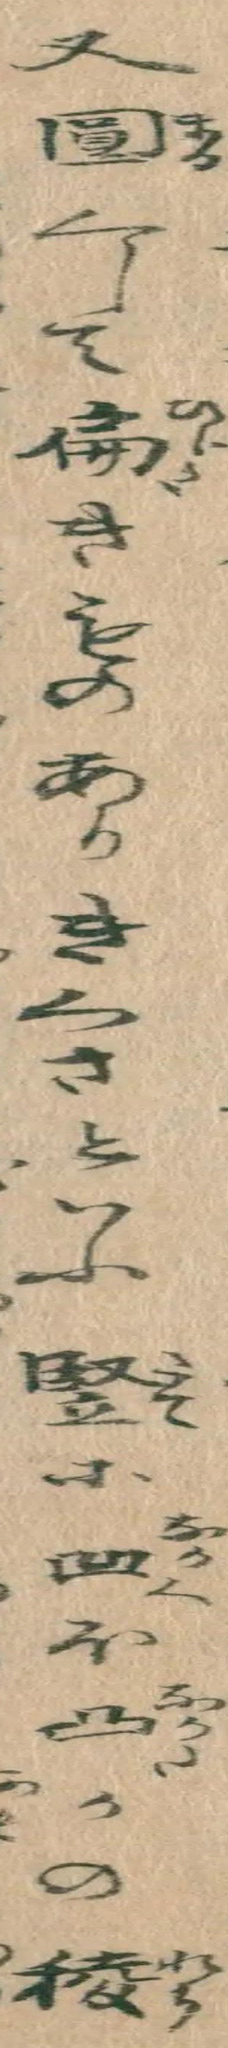又圓くして扁きものありきくさといふ竪に凹ほ凸かの稜
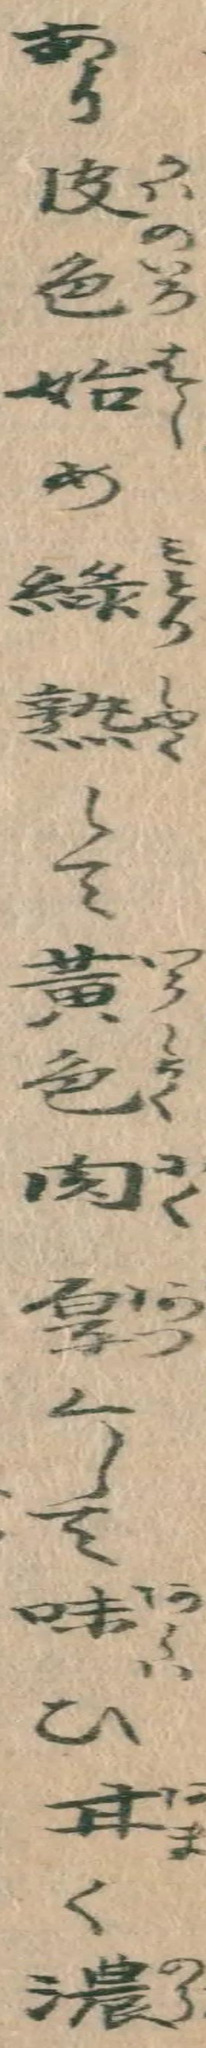あり皮色始め緑熟して黄色肉厚くして味ひ甘く濃
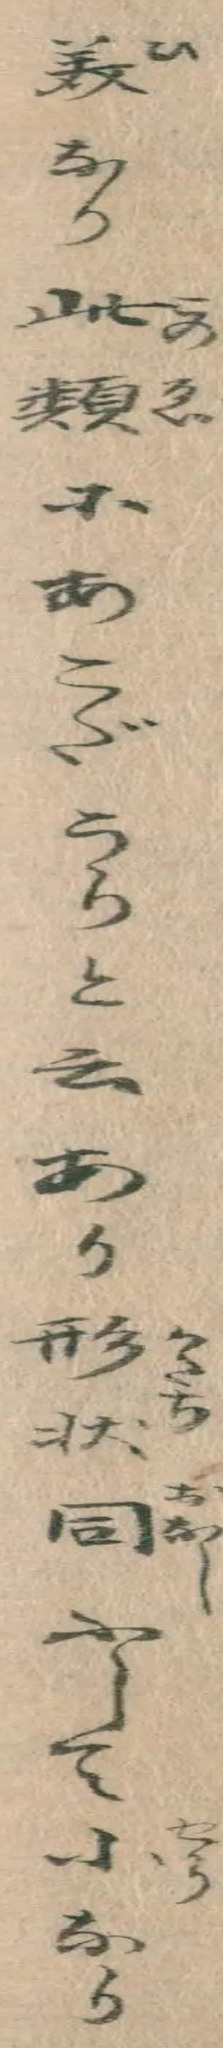美なり此類にあこだうりと云あり形状同にして小なり

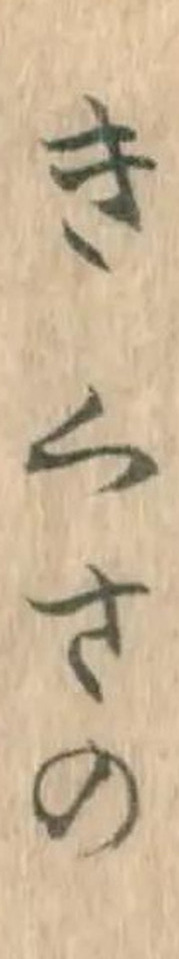きくさの
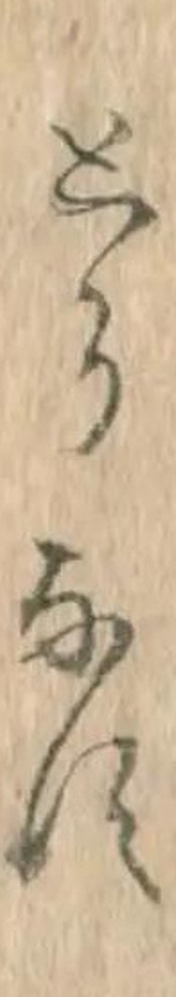とうなす
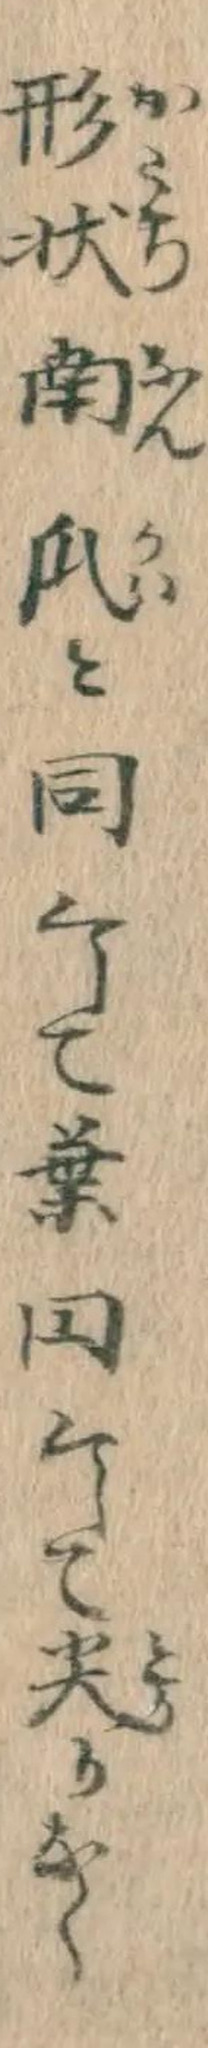形状南瓜と同くして葉円くして尖りなく
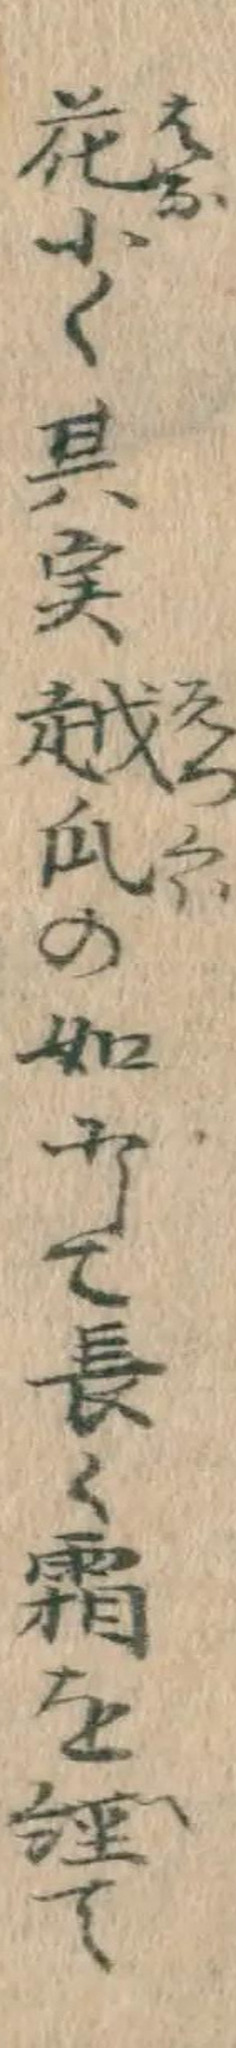花小く其実越瓜の如にして長く霜を経て
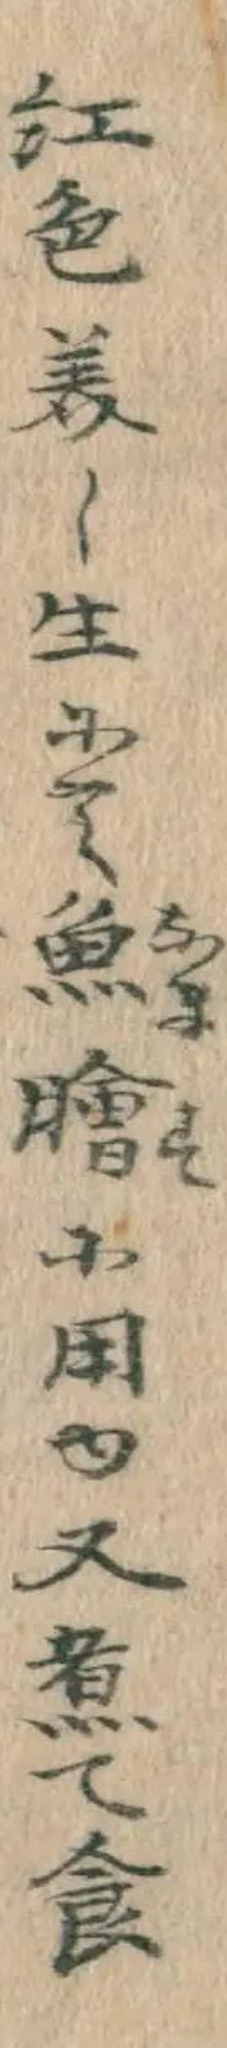紅色美し生にて魚膾に用ゆ又煮て食

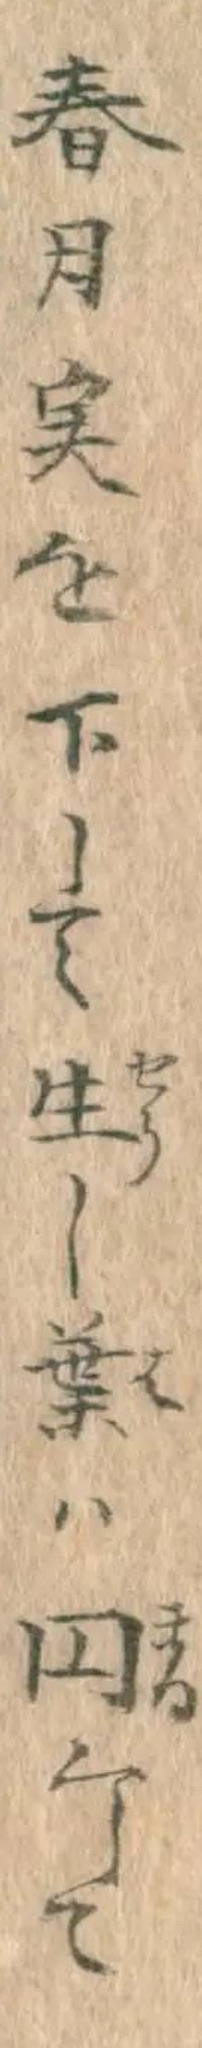春月実を下して生し葉は円くして
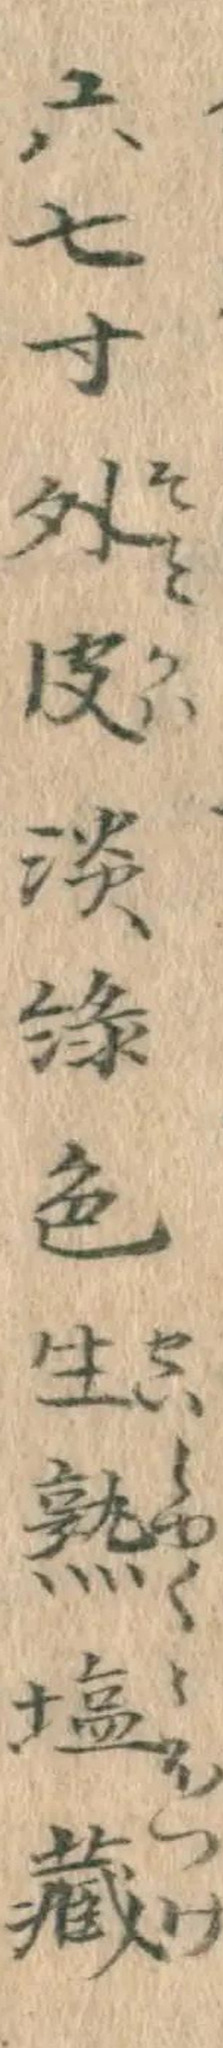六七寸外皮淡緑色生熟塩蔵
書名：本草図譜. 巻52-54
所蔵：国立国会図書館 National Diet Library, JAPAN
